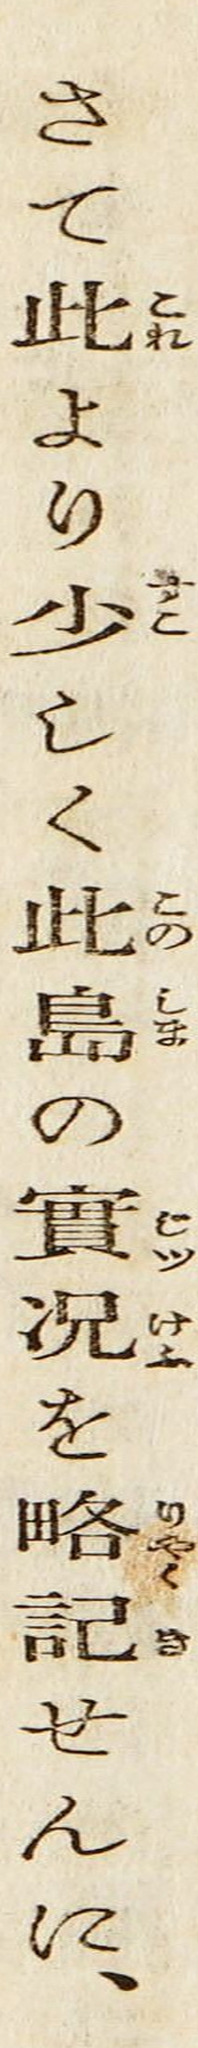さて此より少しく此島の実況を略記せんに、
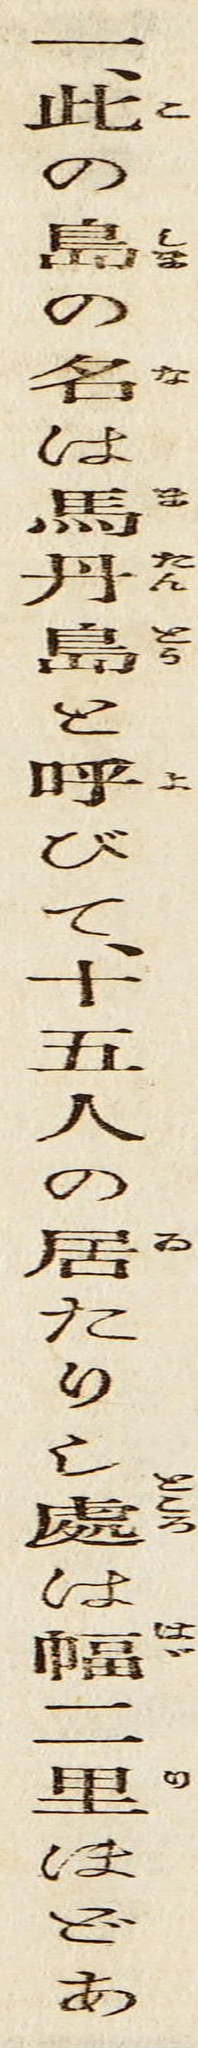一、此の島の名は馬丹島と呼びて、十五人の居たりし処は幅二里ほどあ
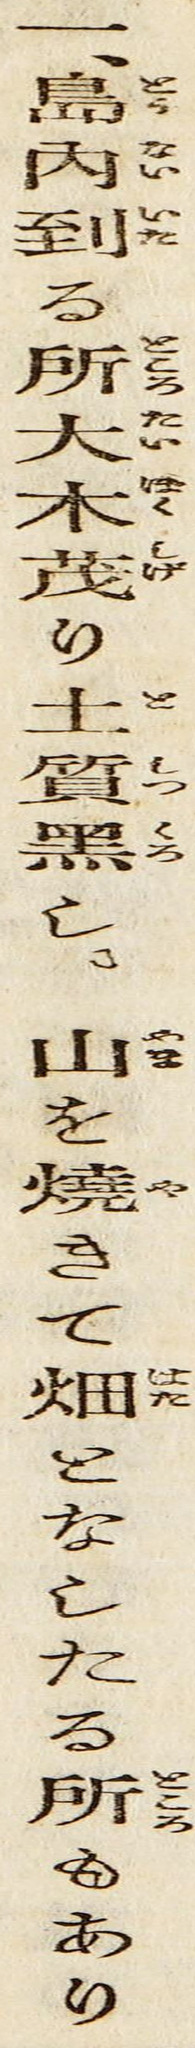一、島内到る所大木茂り土質黒し。山を焼きて畑となしたる所もあり
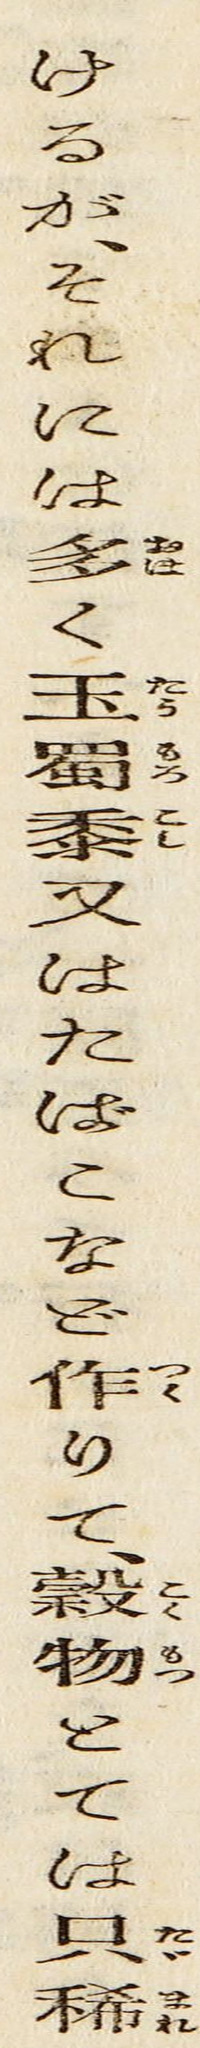けるが、それには多く玉蜀黍又はたばこなど作りて、穀物とては只稀
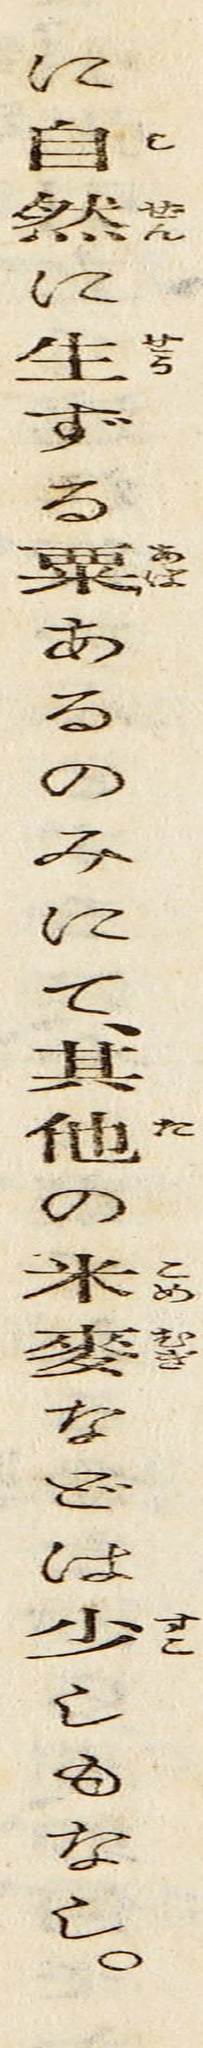に自然に生ずる粟あるのみにて、其他の米麦などは少しもなし。
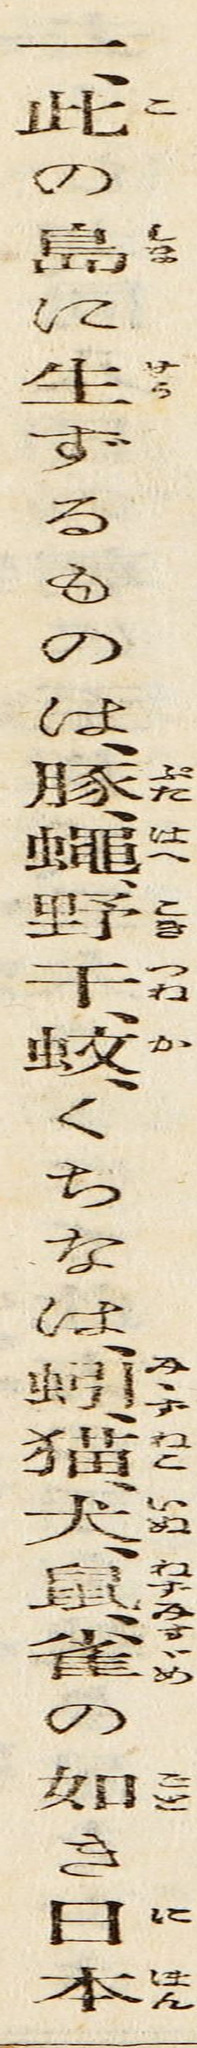一、此の島に生ずるものは、豚、蠅、野干、蚊、くちなは、蚓、猫、犬、鼠、雀の如き日本
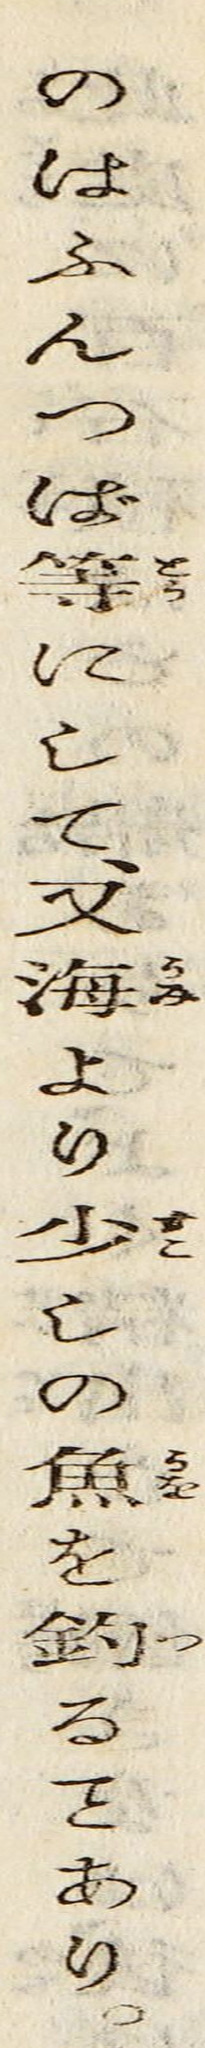のはふんつば等にして、又海より少しの魚を釣ることあり。
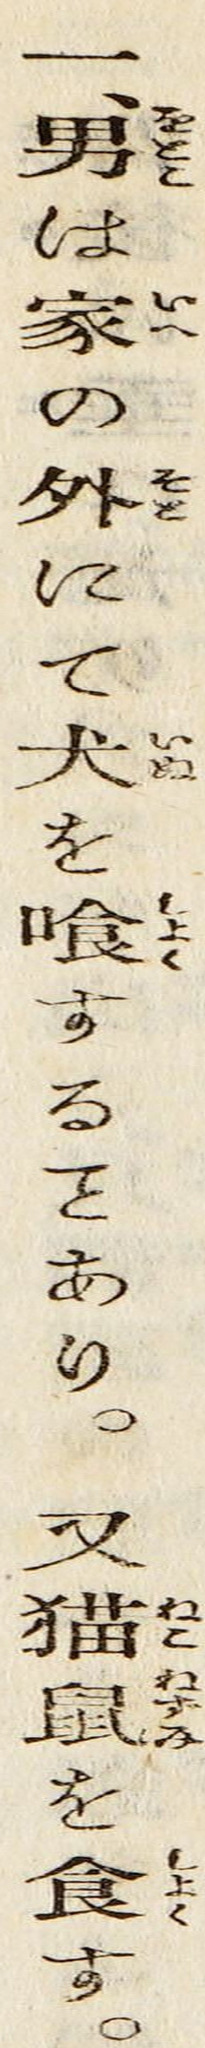一、男は家の外にて犬を喰することあり。又猫鼠を食す。
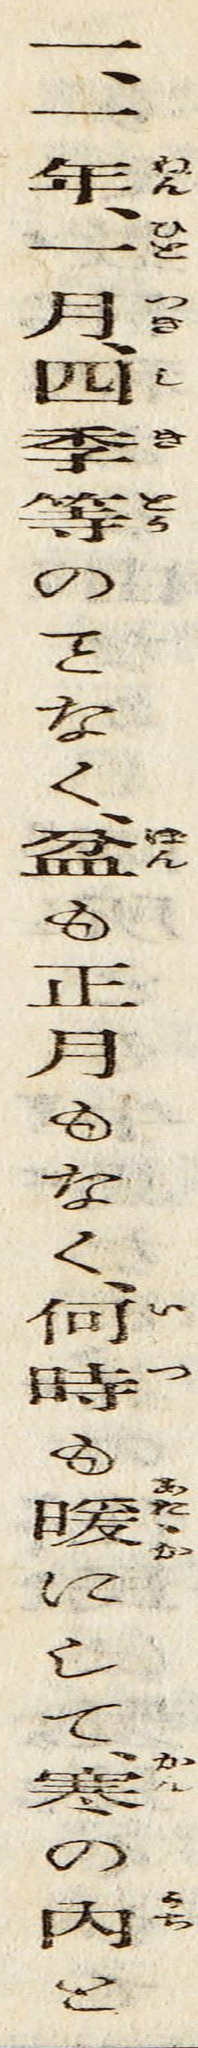一、一年、一月、四季等のことなく、盆も正月もなく、何時も暖にして、寒の内と
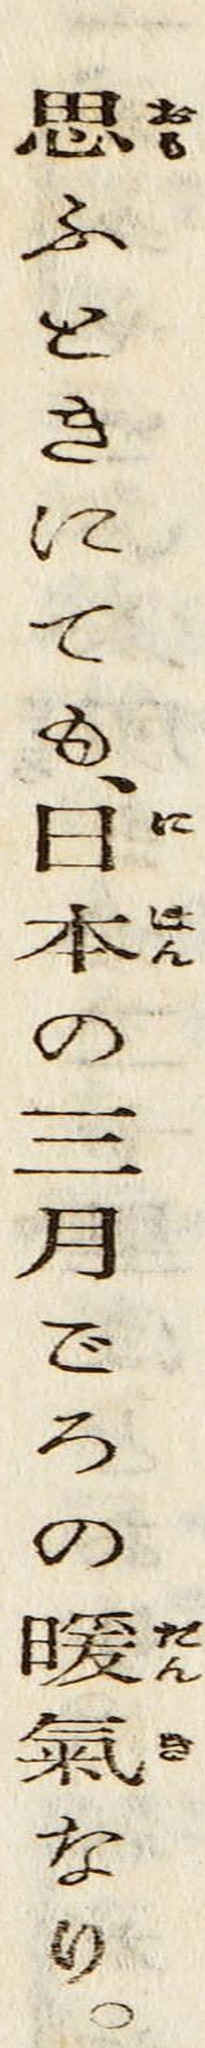思ふときにても、日本の三月ごろの暖気なり。
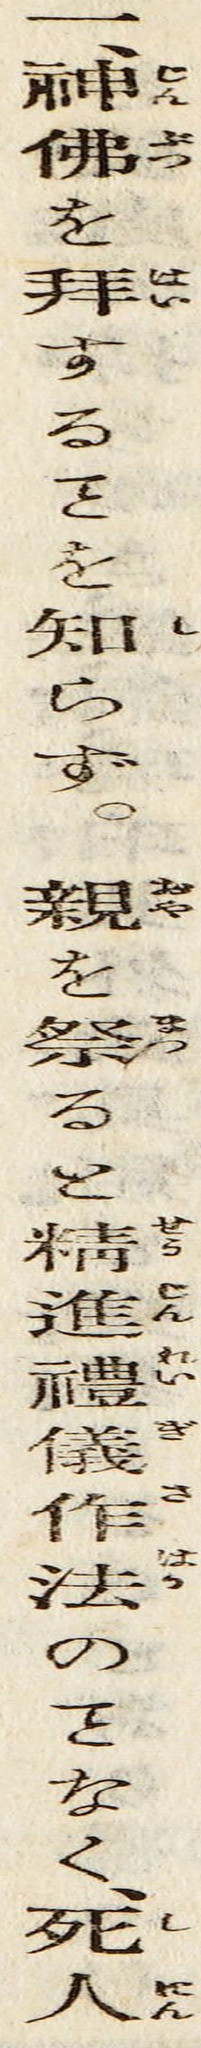一、神仏を拝することを知らず。親を祭ると精進礼儀作法のことなく、死人
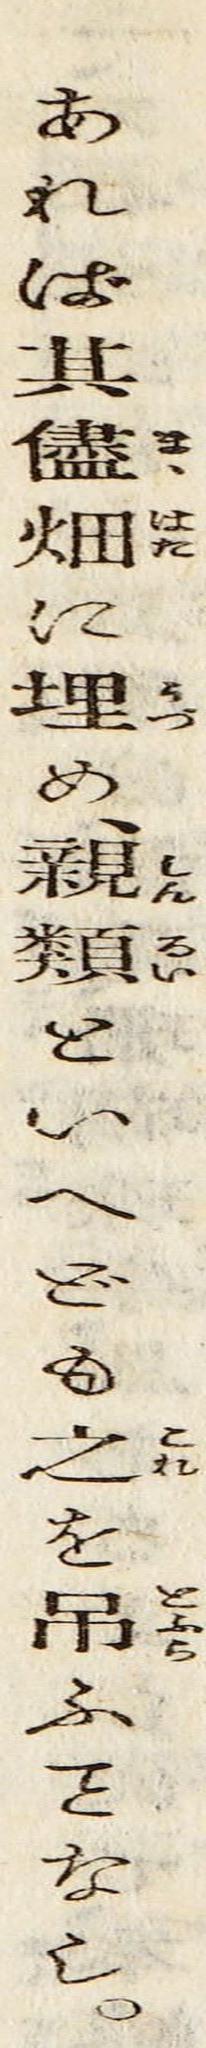あれば其儘畑に埋め、親類といへども之を吊ふことなし。
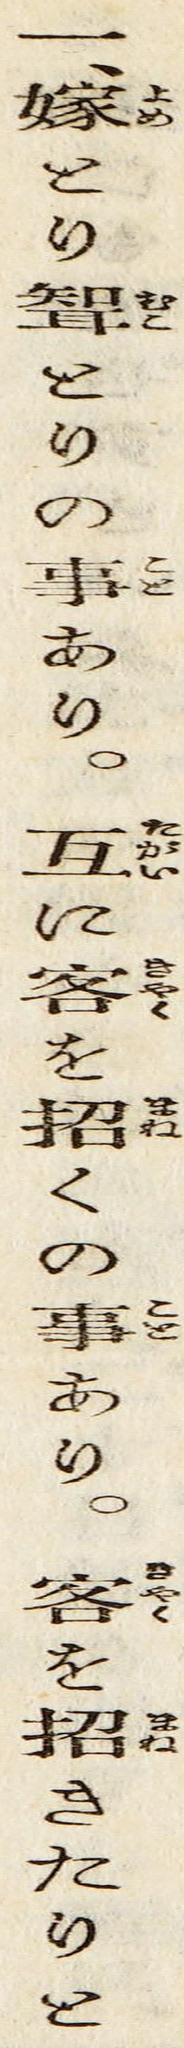一、嫁とり婿とりの事あり。互に客を招くの事あり。客を招きたりと
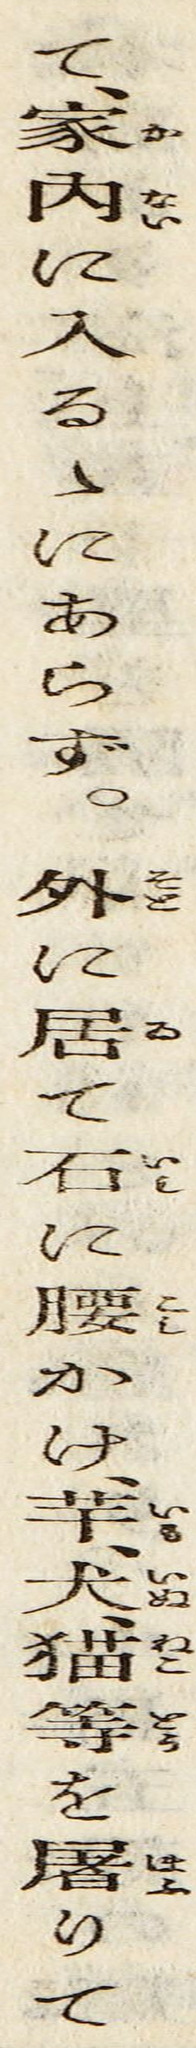て、家内に入るゝにあらず。外に居て石に腰かけ、芋、犬、猫等を屠りて
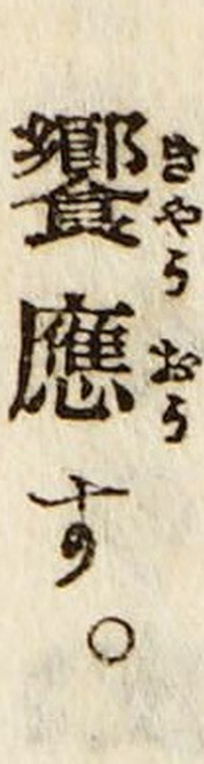饗応す。
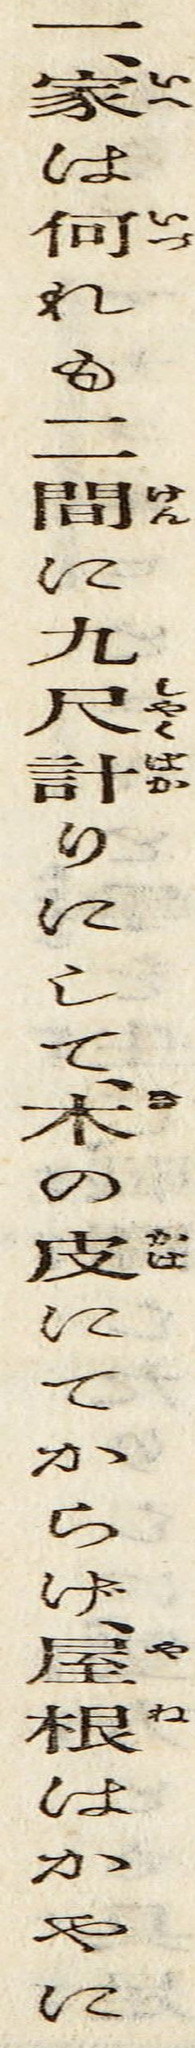一、家は何れも二間に九尺計りにして、木の皮にてからげ、屋根はかやに
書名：日本漂流譚
